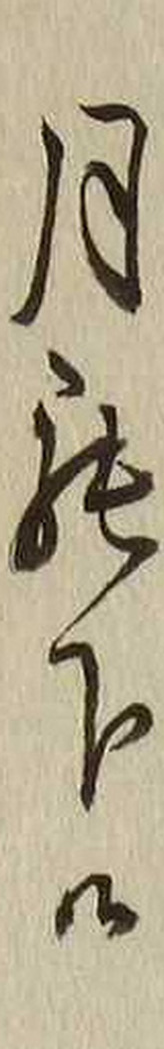月罷下候
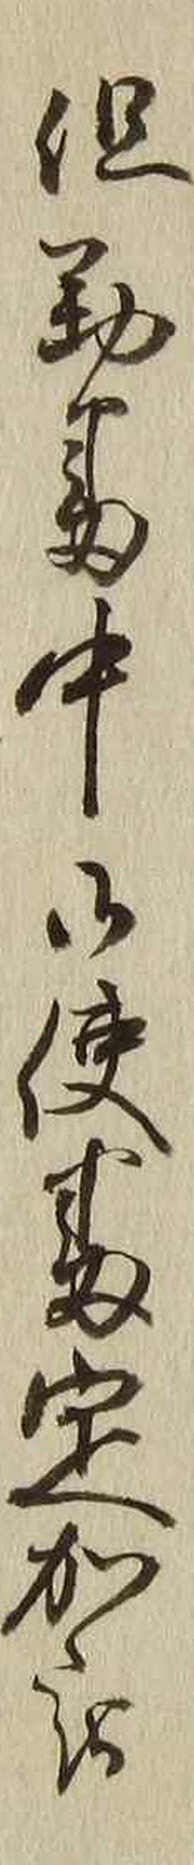但勤番中御使番定加被
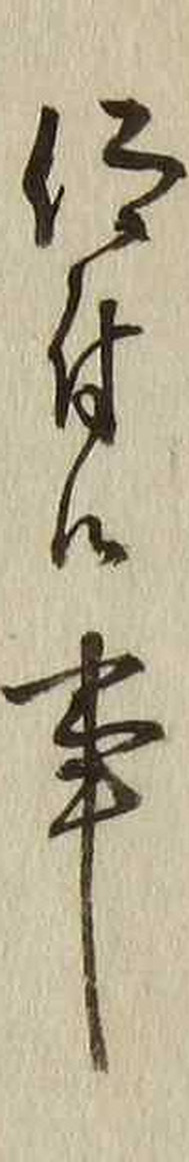仰付候事
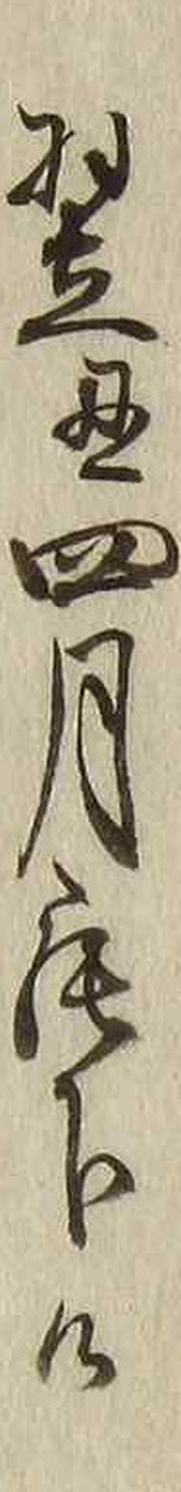翌丑四月罷下候
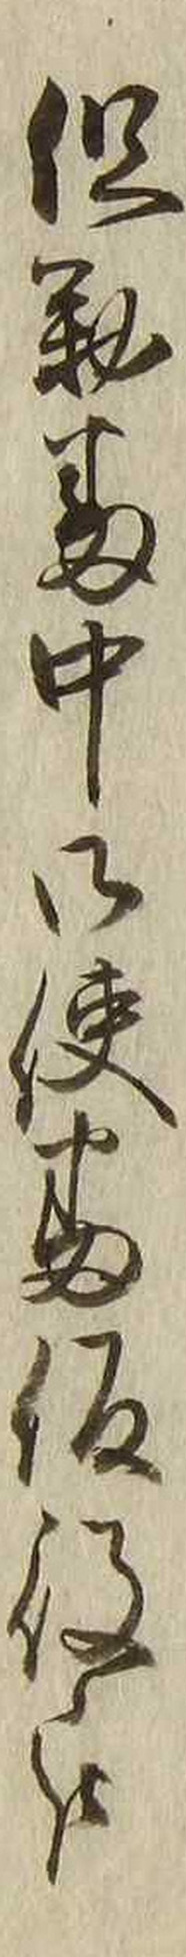但勤番中御使番仮役被
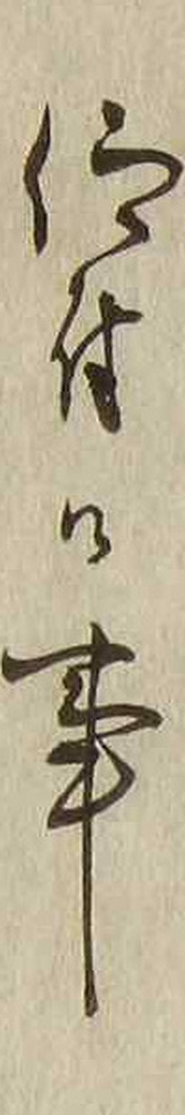仰付候事
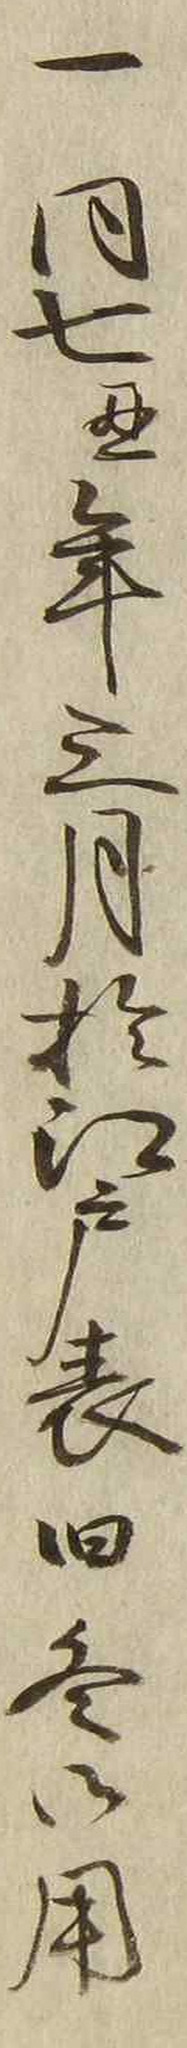一同七丑年三月於江戸表旧冬御用

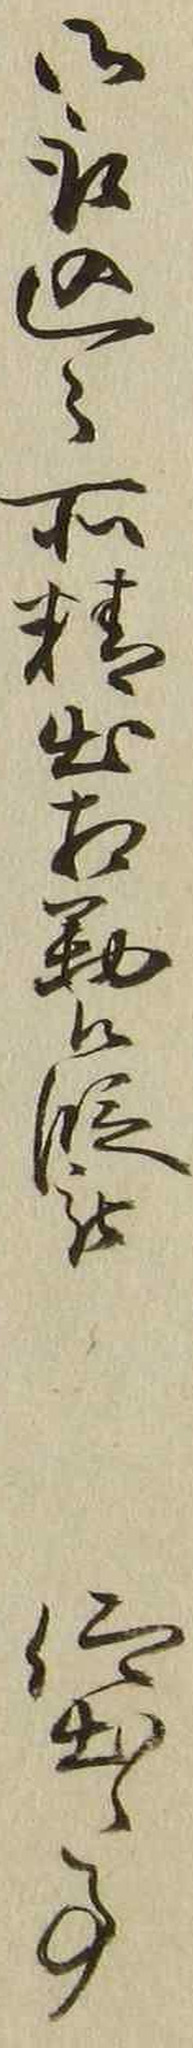御取込之所精出相勤候段被仰出候事
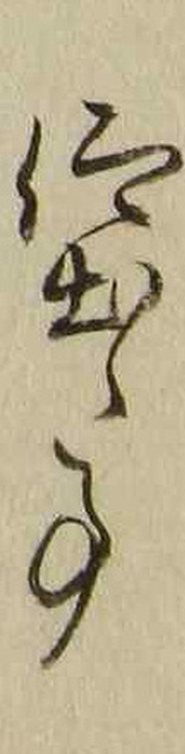仰出候事
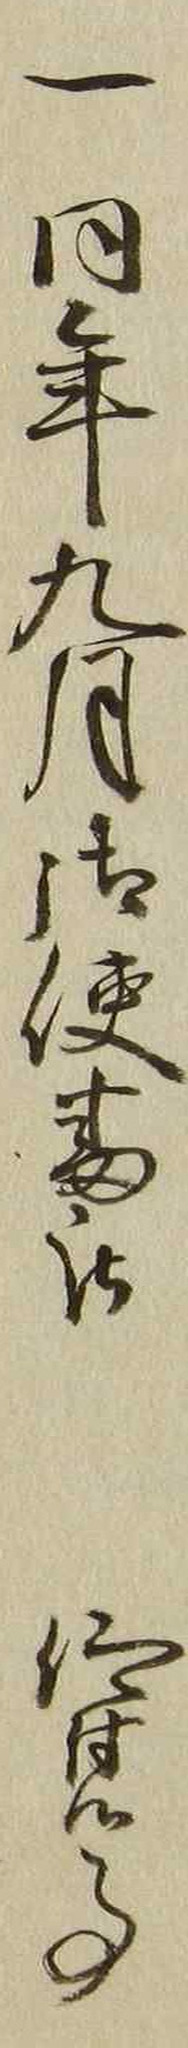一同年九月御使番被仰付候事
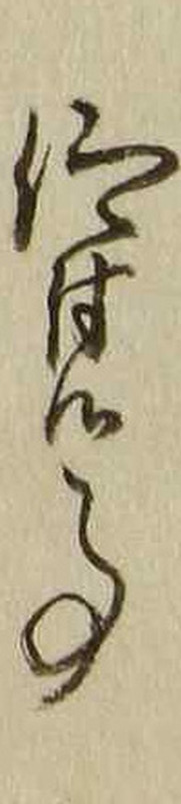仰付候事
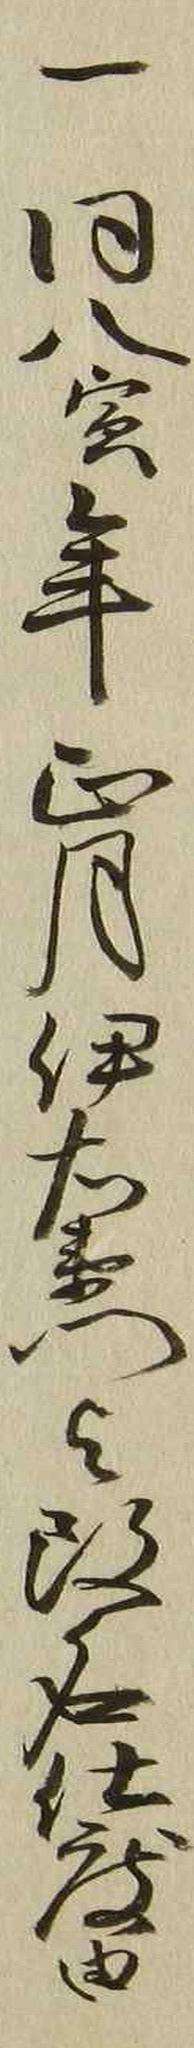一同八寅年正月伊右衛門与改名仕度由
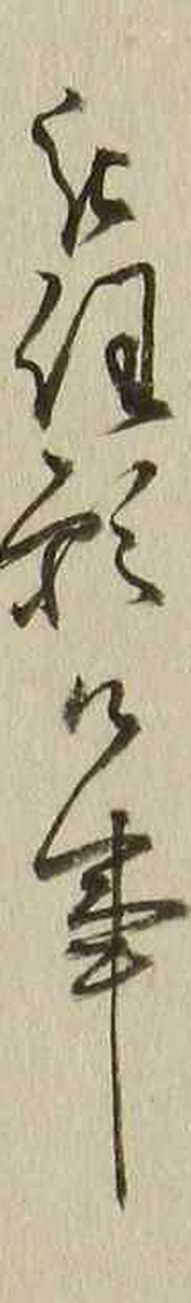被任願候事
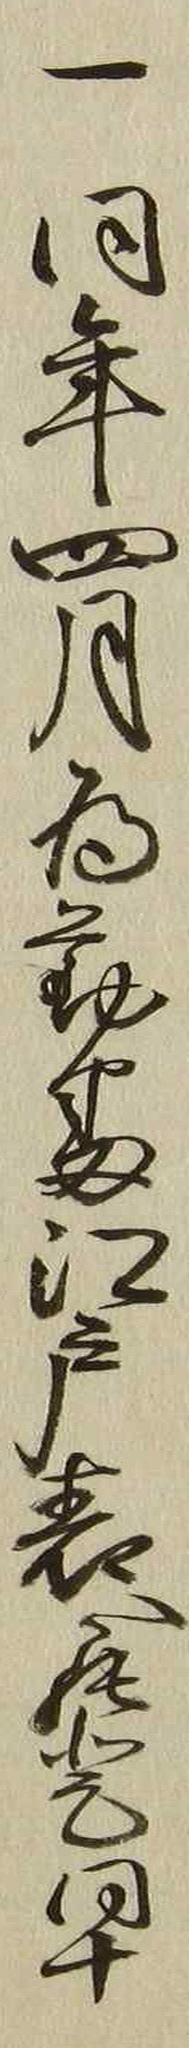一同年四月為勤番江戸表へ罷登同十
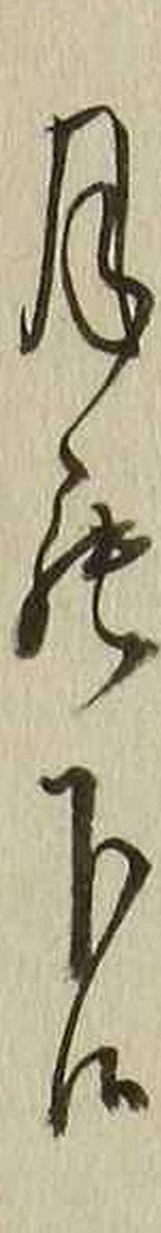月罷下候
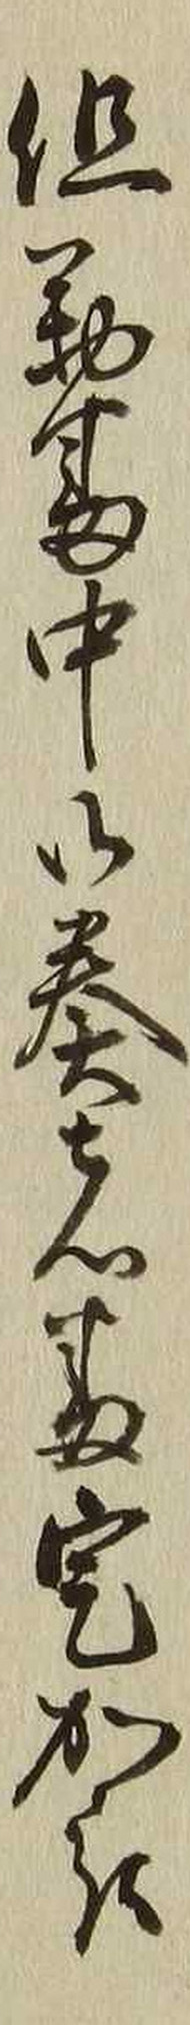但勤番中御奏者番定加被
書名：諸士系譜　巻之60　と之部3
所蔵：会津若松市立会津図書館
